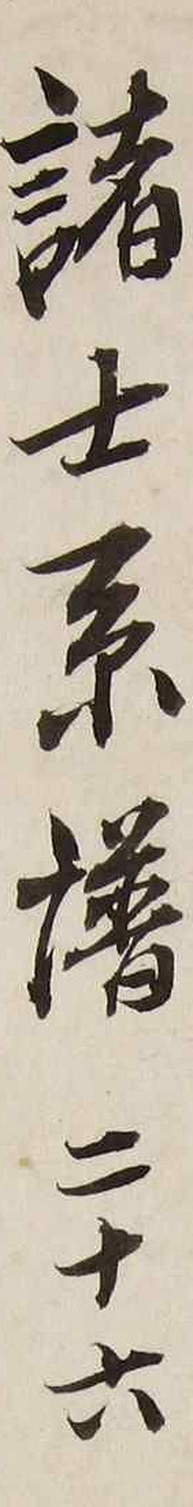諸士系譜二十六

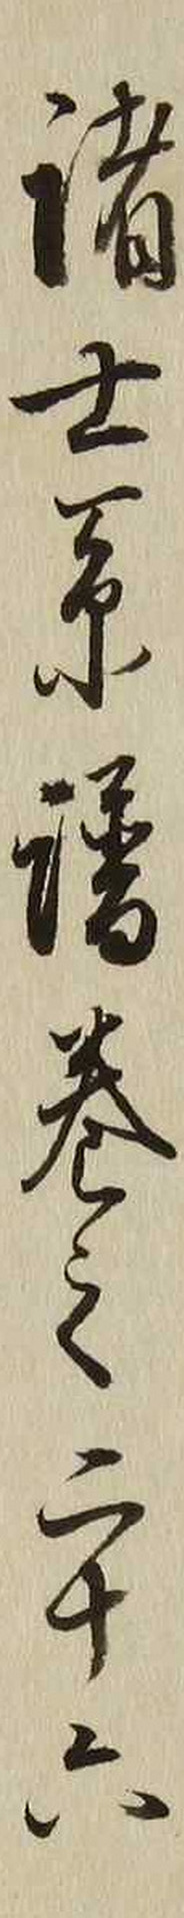諸士系譜巻之二十六
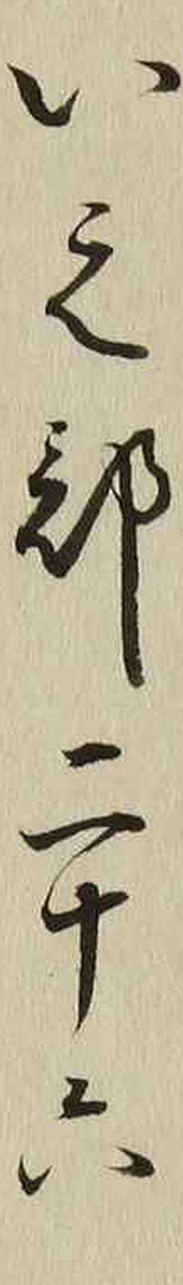い之部二十六
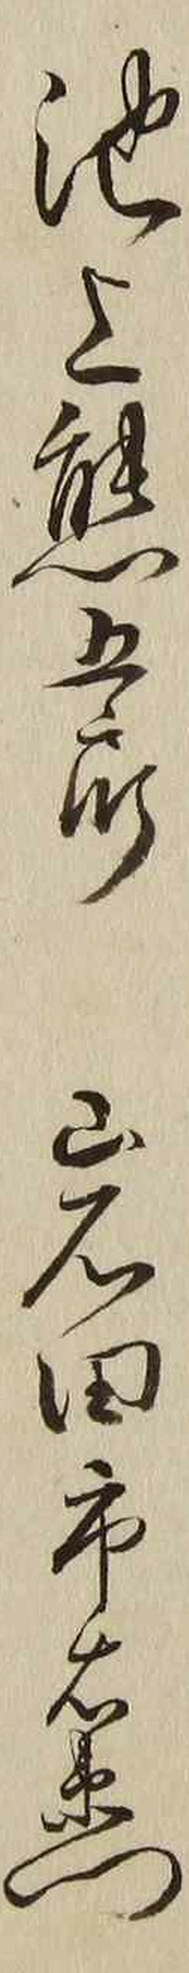池上熊五郎岩田市右衛門
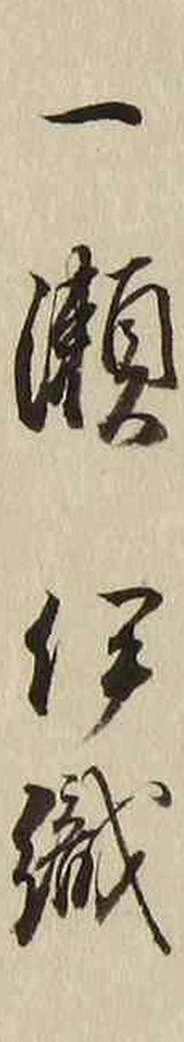一瀬伊織

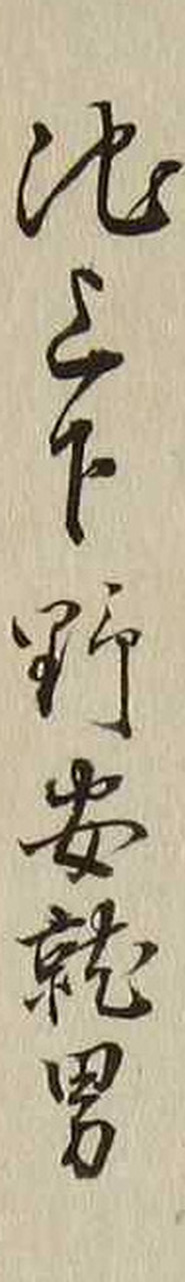池上下野安就男
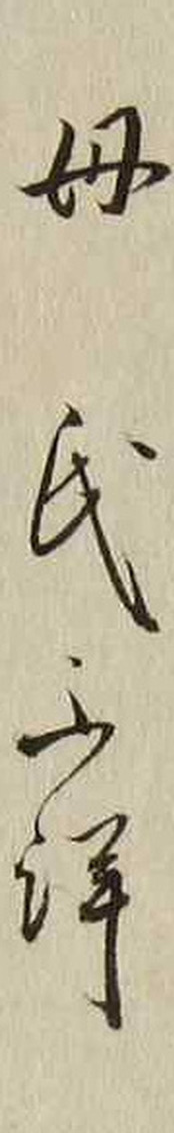母氏不詳
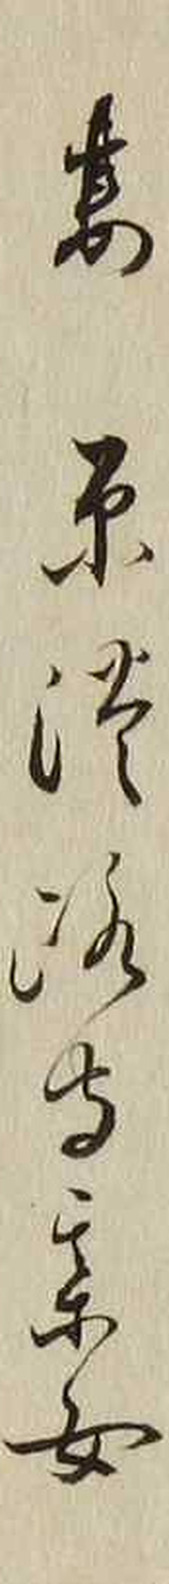妻原淡路守某女
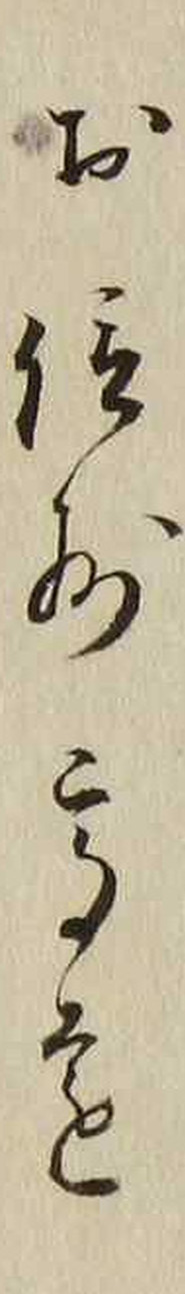於信州高遠
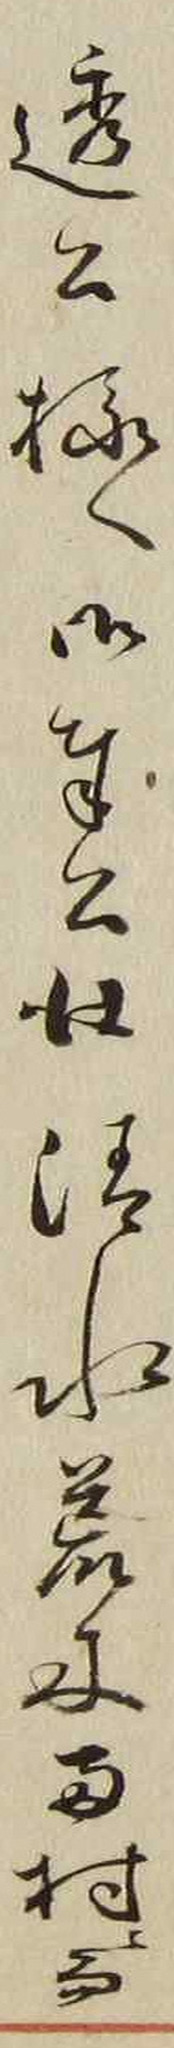透公様へ御奉公仕清水荒木両村ニ而
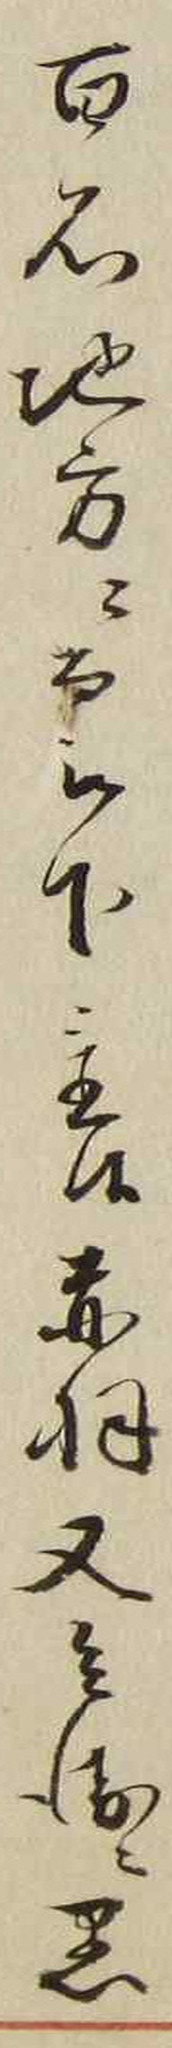百石地方ニ而被下置候赤羽又兵衛ニ黒

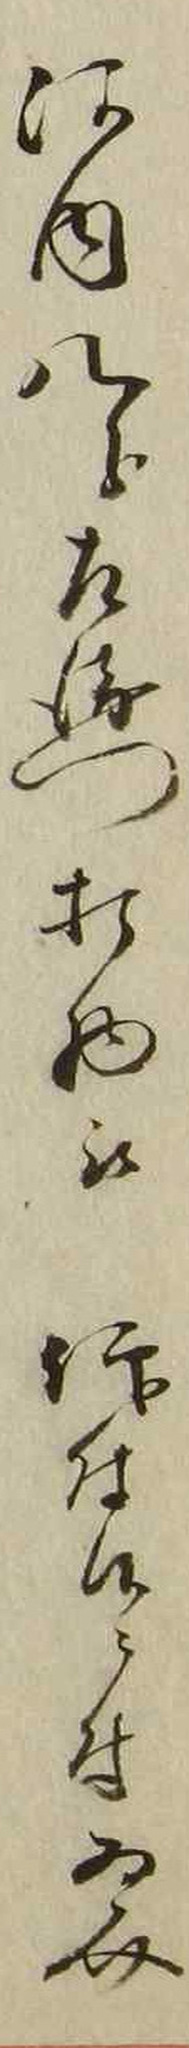河内八郎左衛門打物被仰付候ニ付為介
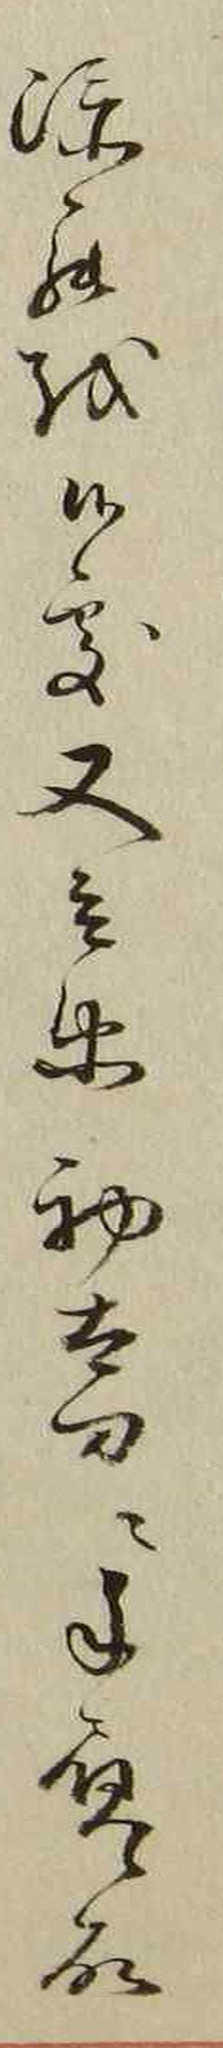添罷越候処又兵衛初太刀ニ手負候故
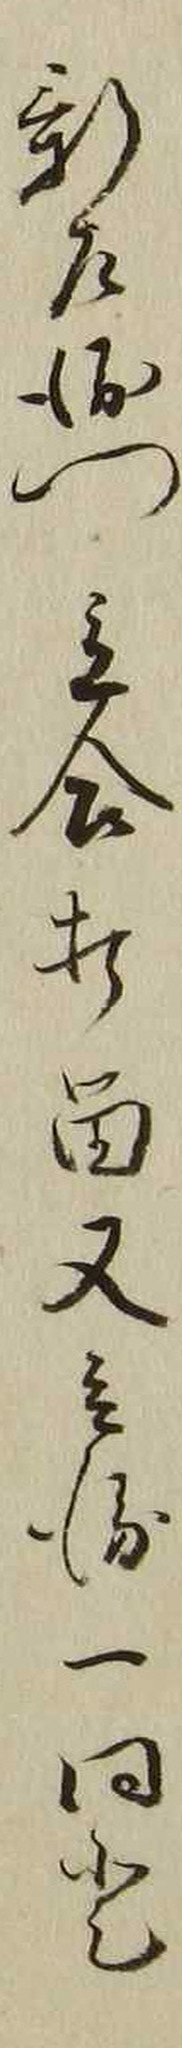新左衛門立合打留又兵衛一同登
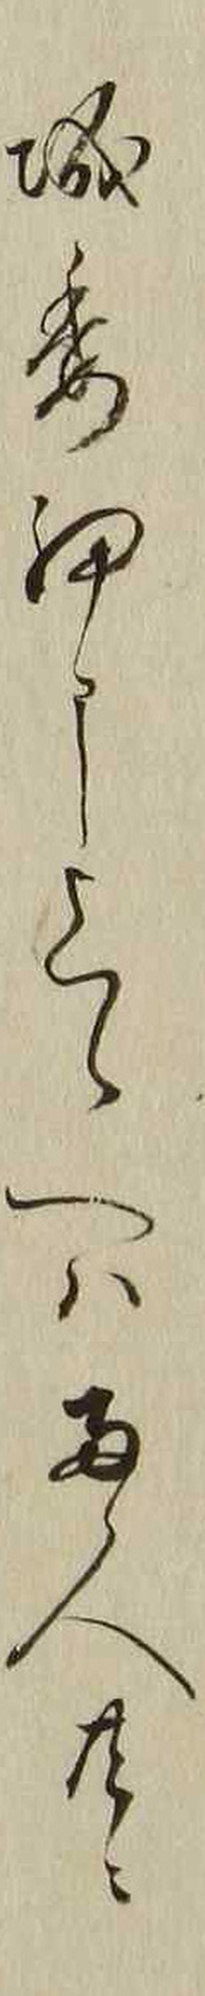城委細申上候へハ両人共ニ
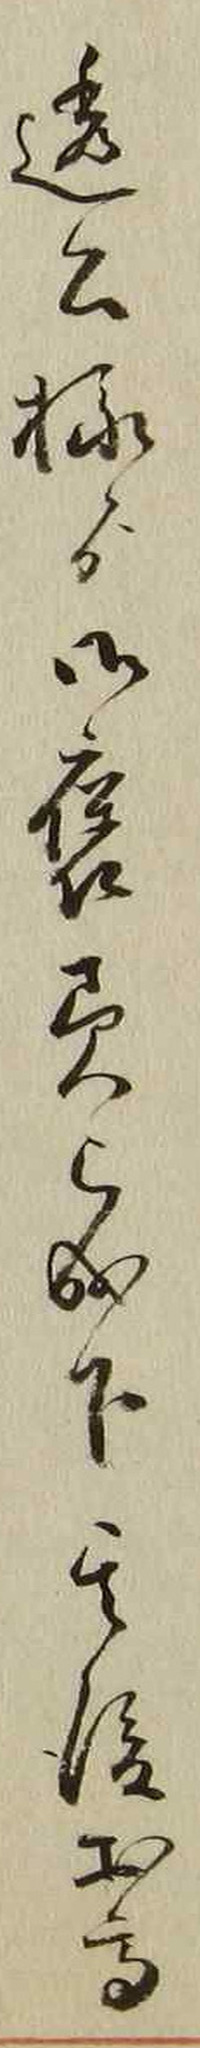透公様ゟ御褒美被成下其後於高
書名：諸士系譜　巻之26　い之部26
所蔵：会津若松市立会津図書館
